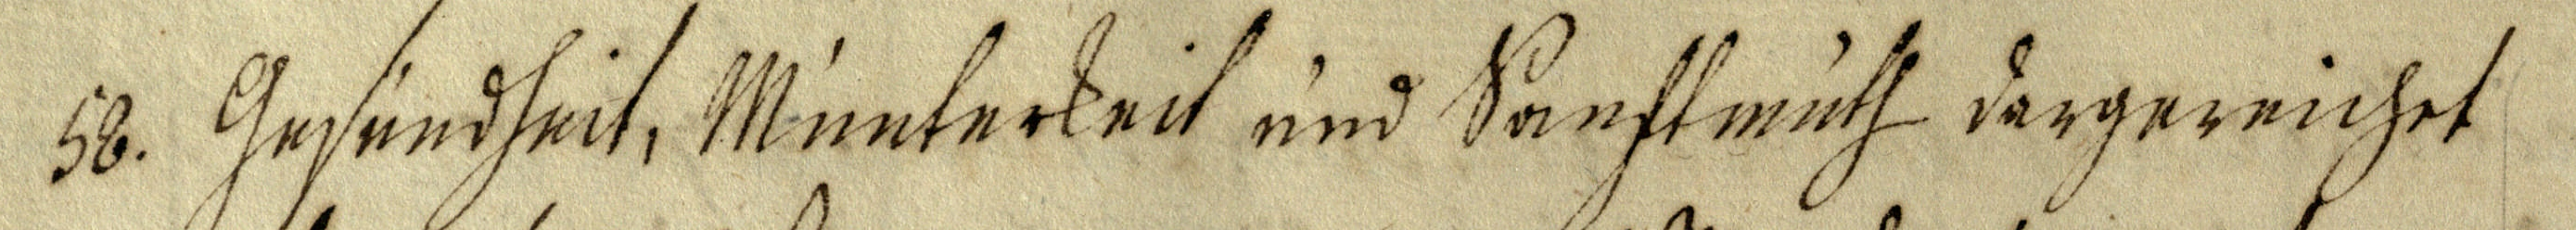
Gesundheit, Munterkeit und Sanftmuth dargereichet
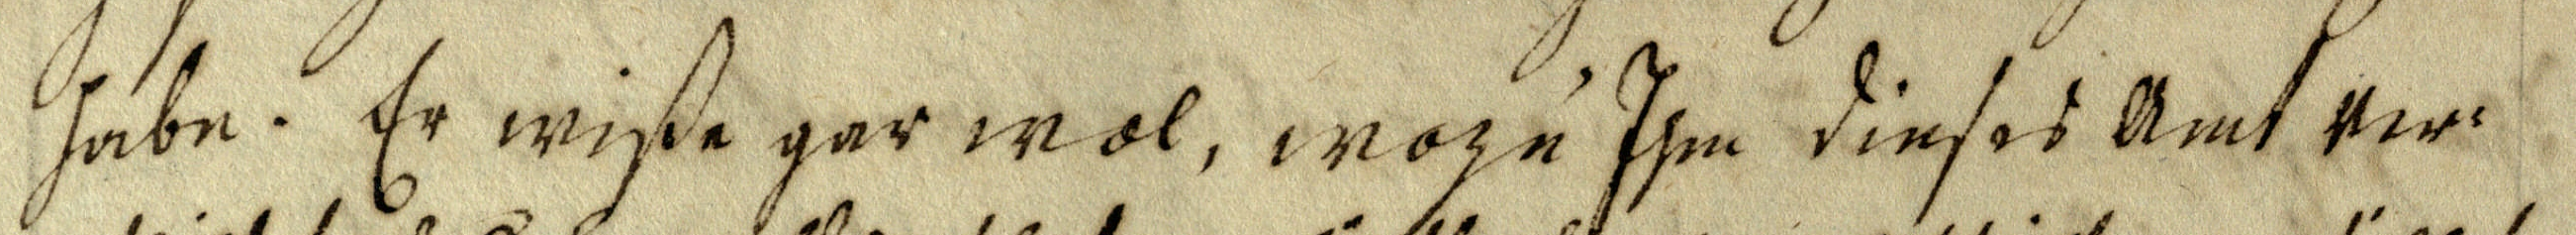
habe. Er wiße gar wol, wozu Ihm dieses Amte ver¬
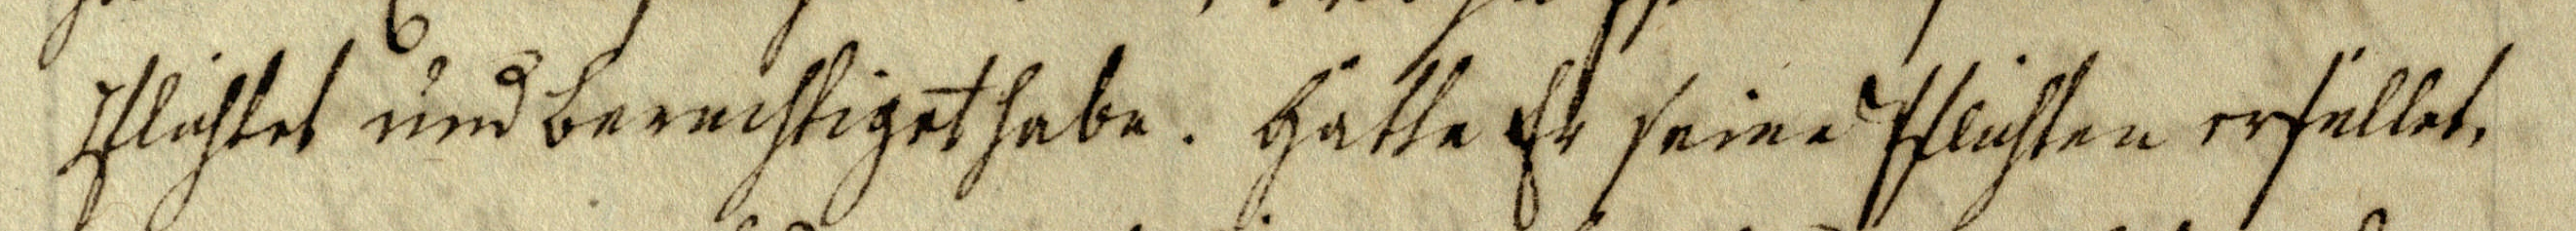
pflichtet und berechtiget habe. Hätte Er seine Pflichten erfüllet,
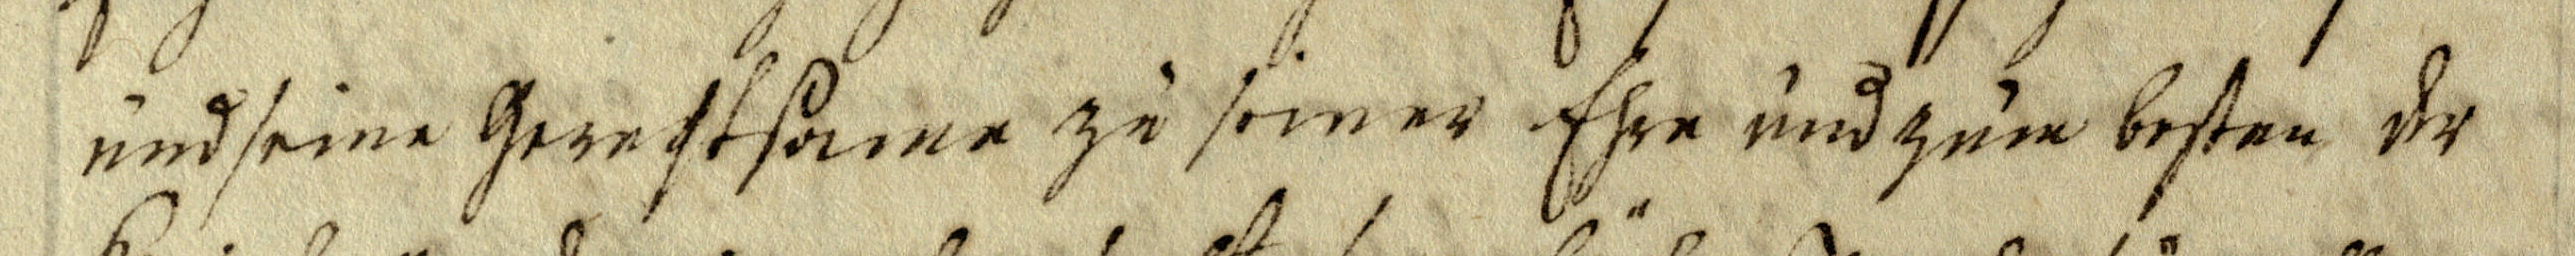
und seine Gerechtsame zuseiner Ehre und zum besten der
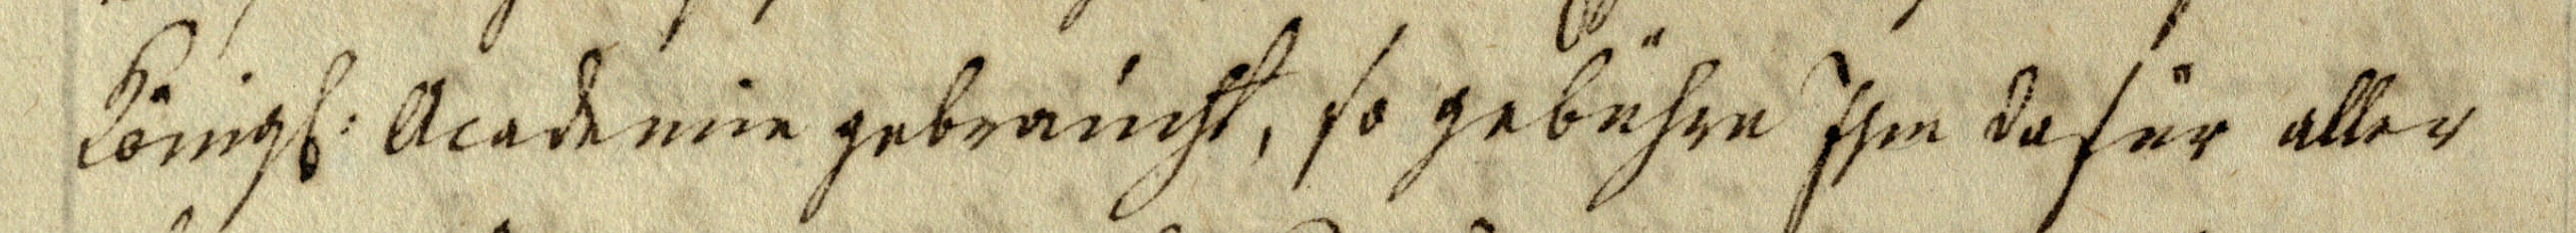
Königl. Academie gebraucht, so gebühre Ihm dafür aller
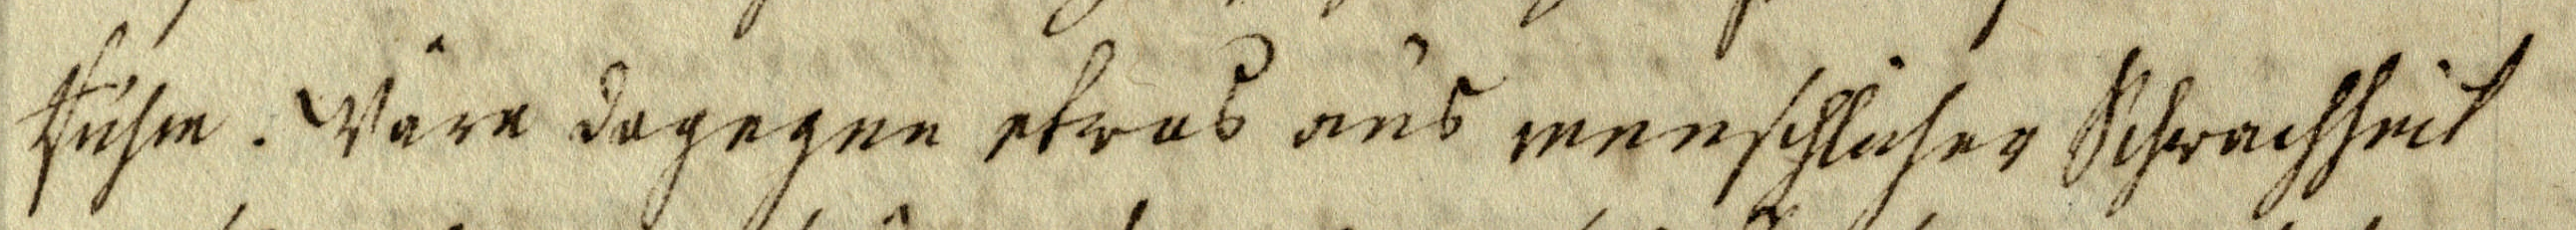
Ruhm. Wäre dagegen etwas aus menschlicher Schwachheit
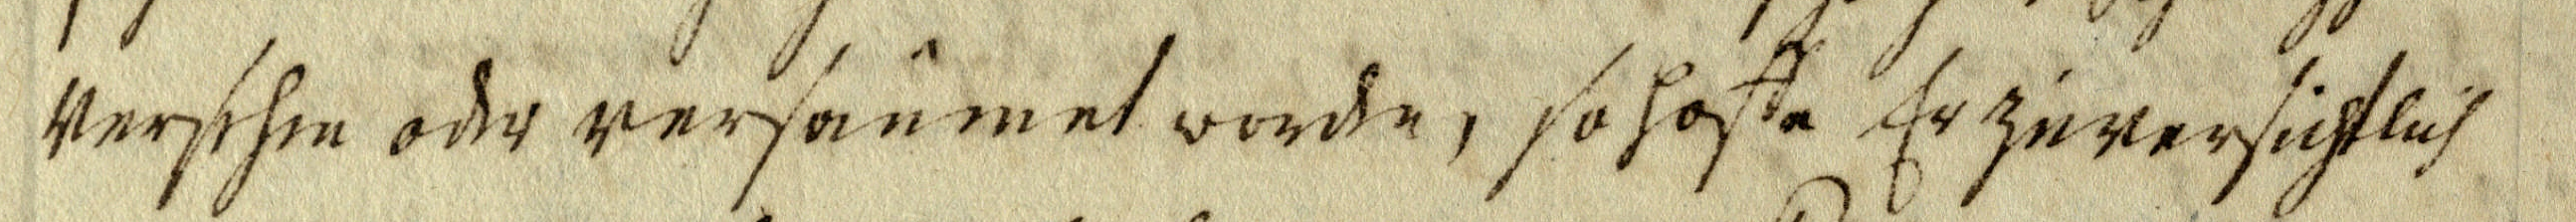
versehen oder versäumet worden, so hoffe Er zuversichtlich
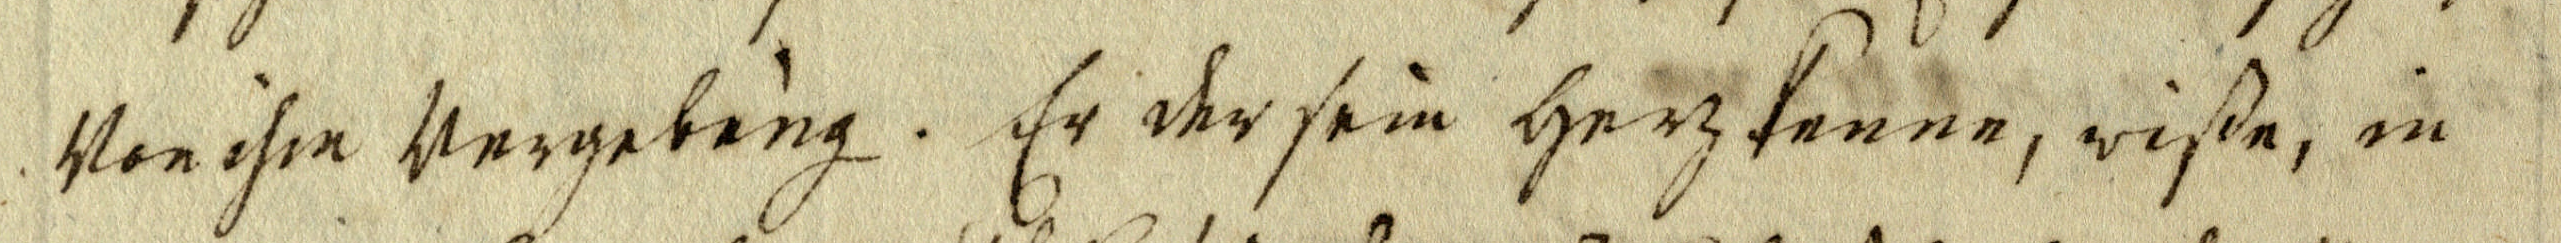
von ihm Vergebung. Er der sein Herz kenne, wiße, in
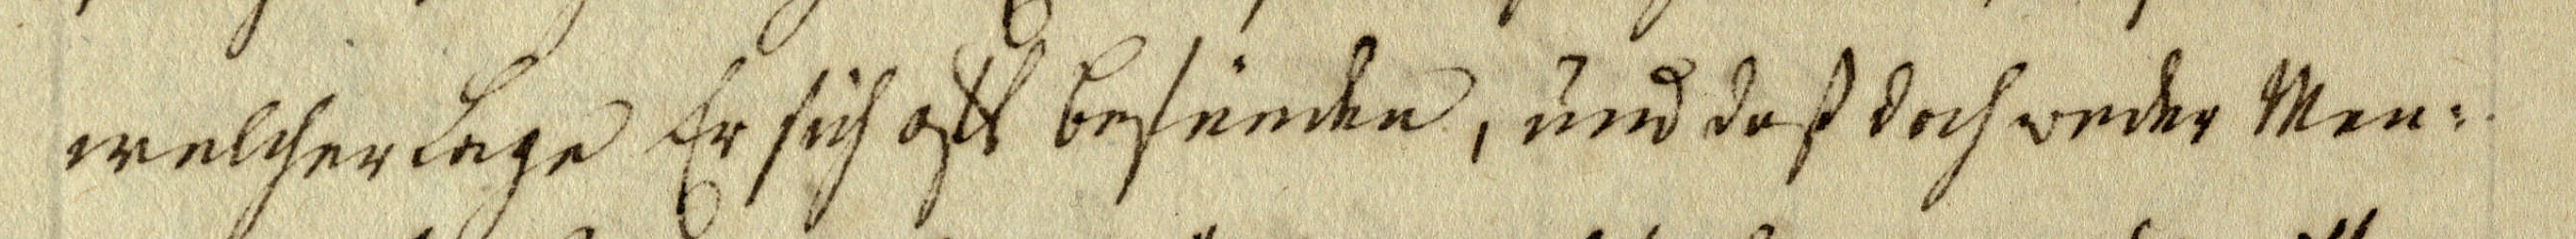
welcher Lage Er sich oft befunden, und daß doch weder Men¬
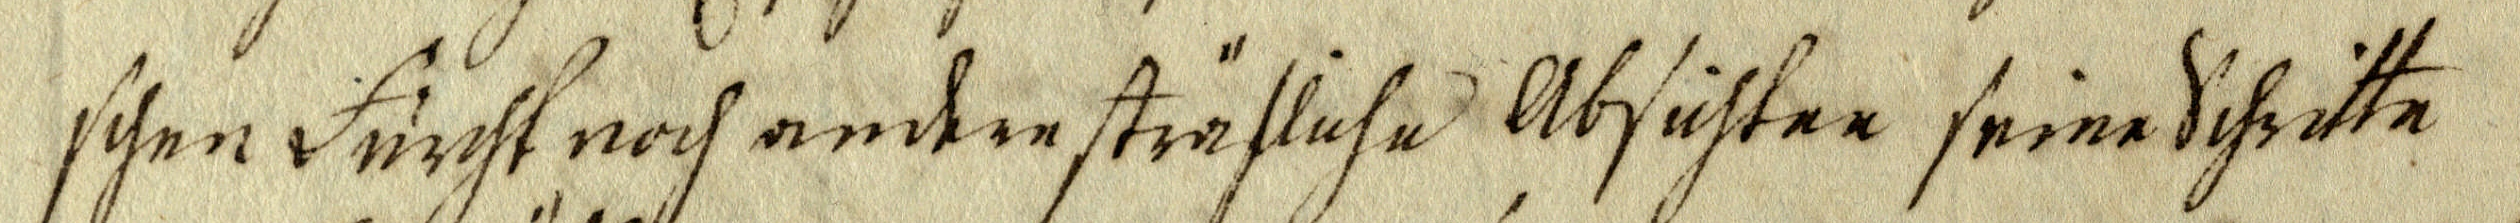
schen Furcht noch andere sträfliche Absichten seine Schritte
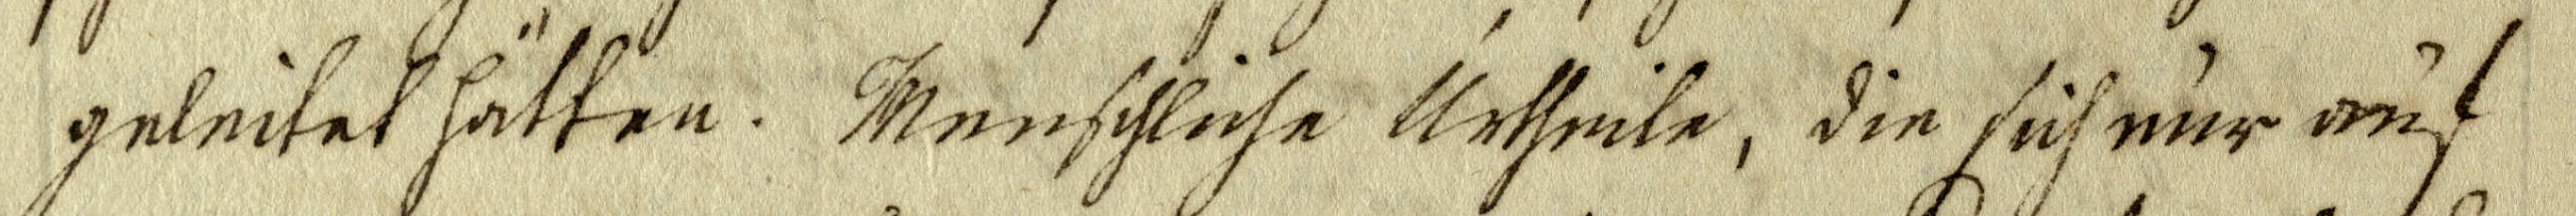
geleitet hätten. Menschliche Urtheile, die sich nur auf
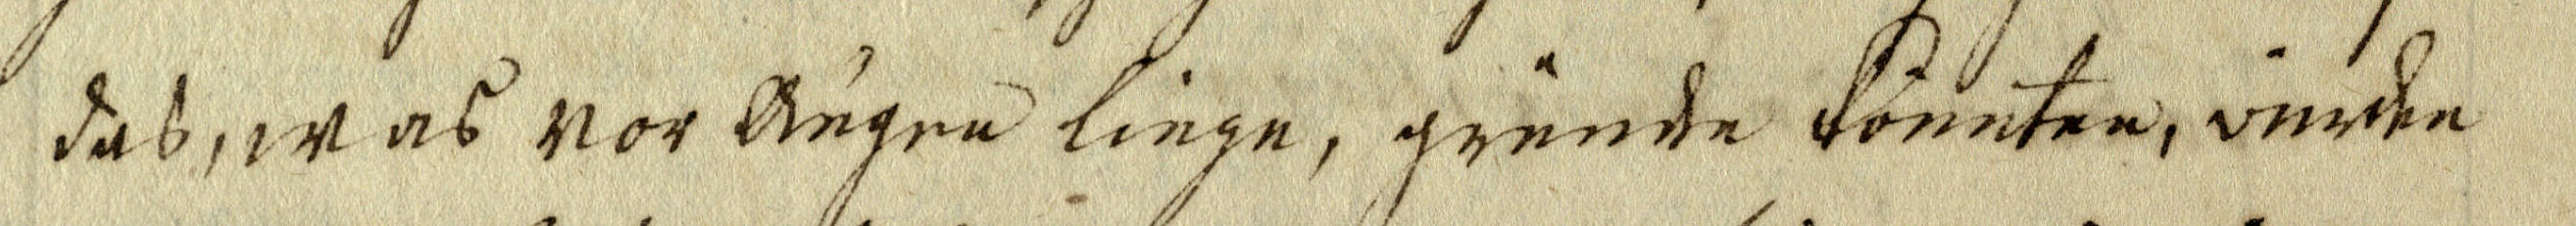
das, was vor Augen liege, gründen könnten, würden
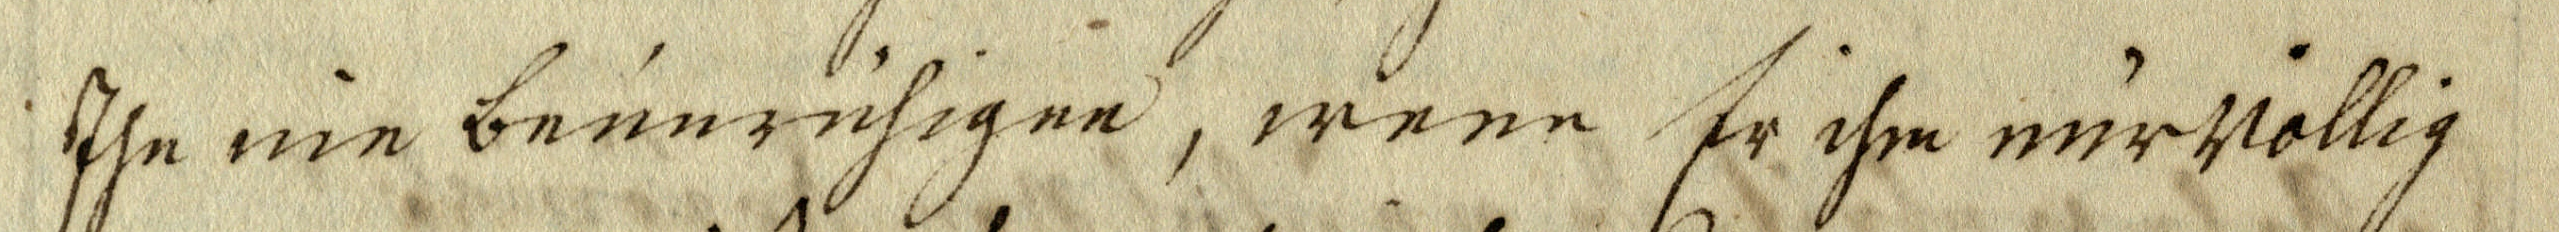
Ihn nie beunruhigen, wenn Er ihm nur völlig
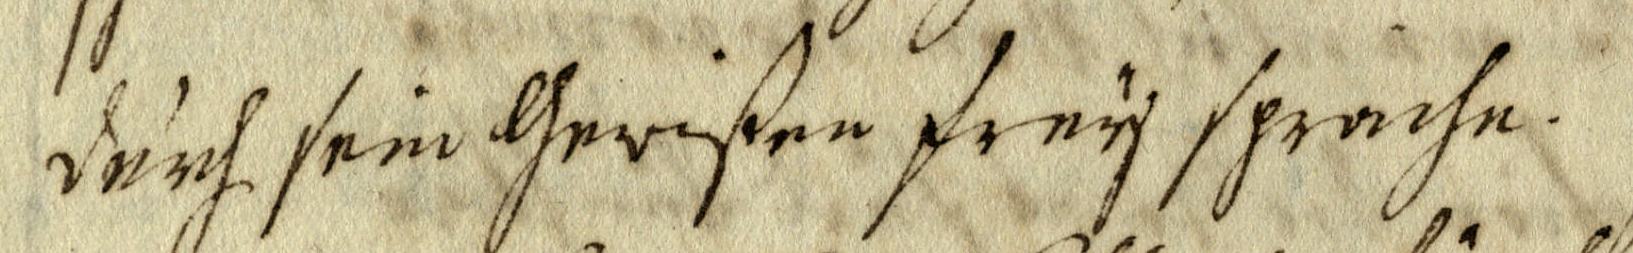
durch sein Gewißen freÿ spräche.
